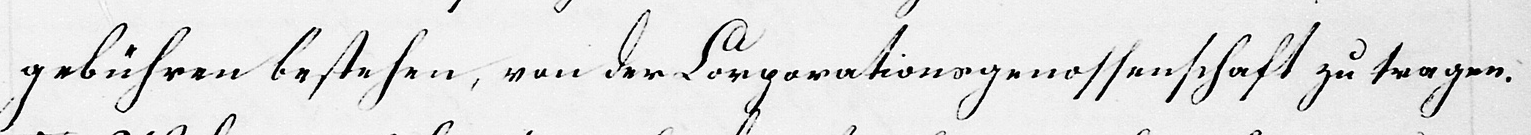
gebühren bestehen, von der Corporationsgenossenschaft zu tragen.
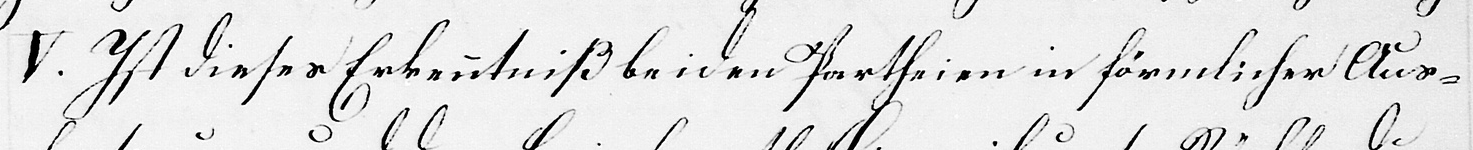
V. Ist dieses Erkenntniß beiden Partheien in förmlicher Aus¬
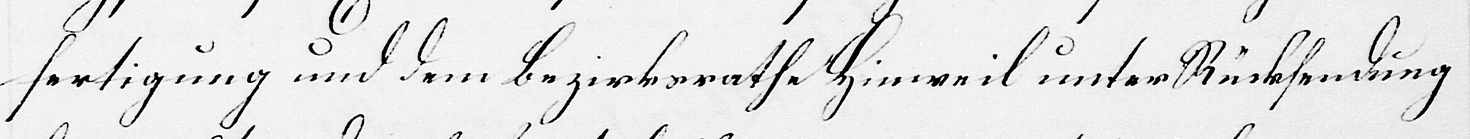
fertigung und dem Bezirksrathe Hinweil unter Rücksendung
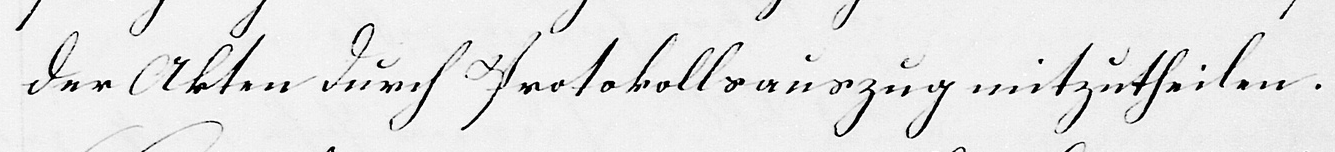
der Akten durch Protokollsauszug mitzutheilen.
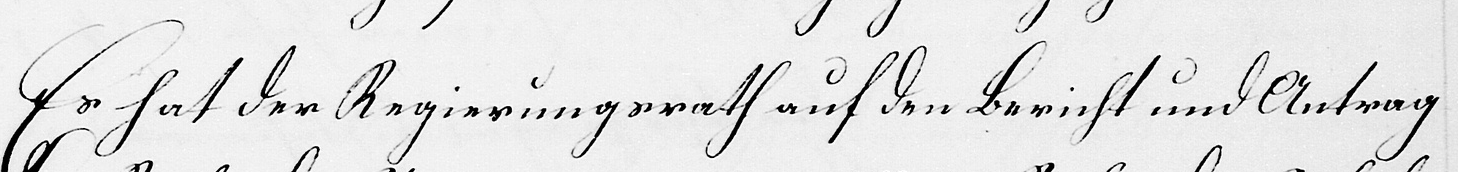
Es hat der Regierungsrath auf den Bericht und Antrag
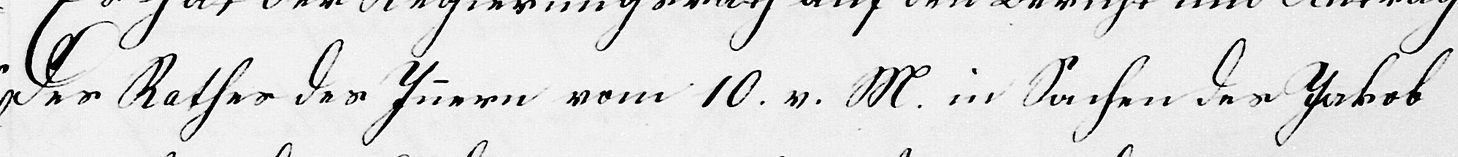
des Rathes des Innern vom 10. v. M. in Sachen des Jakob
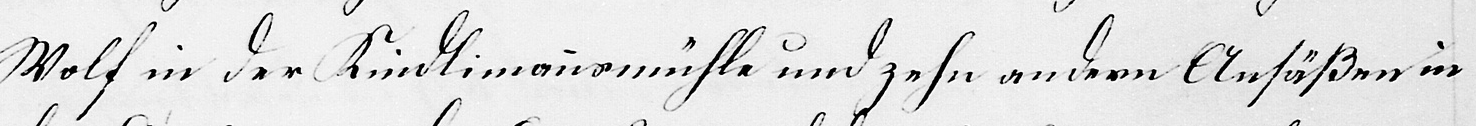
Wolf in der Kindlimannsmühle und zehn andern Ansäßen in
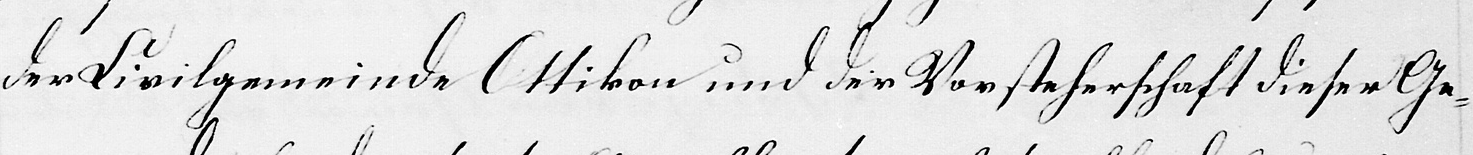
der Civilgemeinde Ottikon und der Vorsteherschaft dieser Ge¬
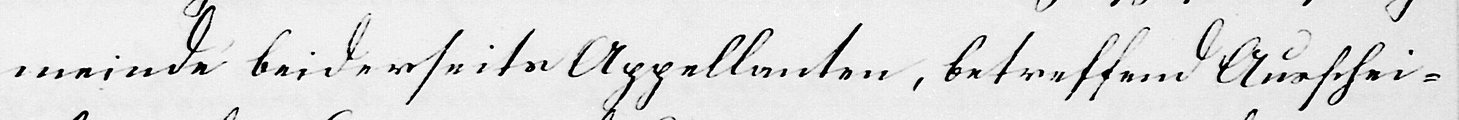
meinde beiderseits Appellanten, betreffend Ausschei¬
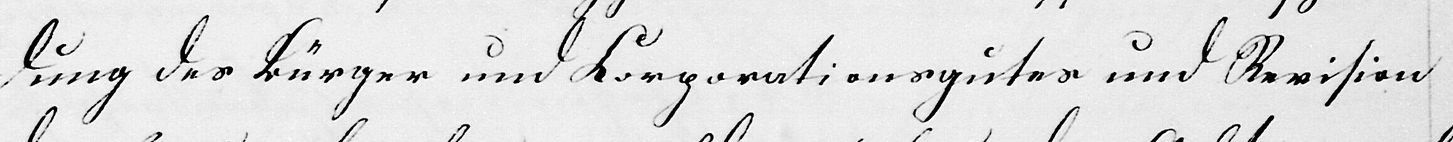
dung des Bürger und Corporationsgutes und Revision
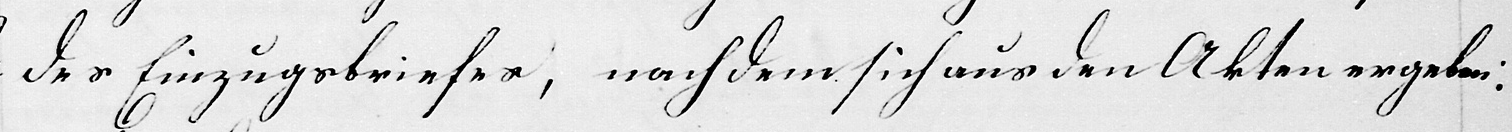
des Einzugsbriefes, nachdem sich aus den Akten ergeben:
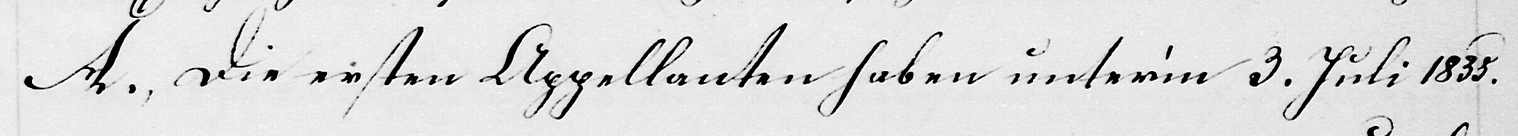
A., Die ersten Appellanten haben unterm 3. Juli 1835.
